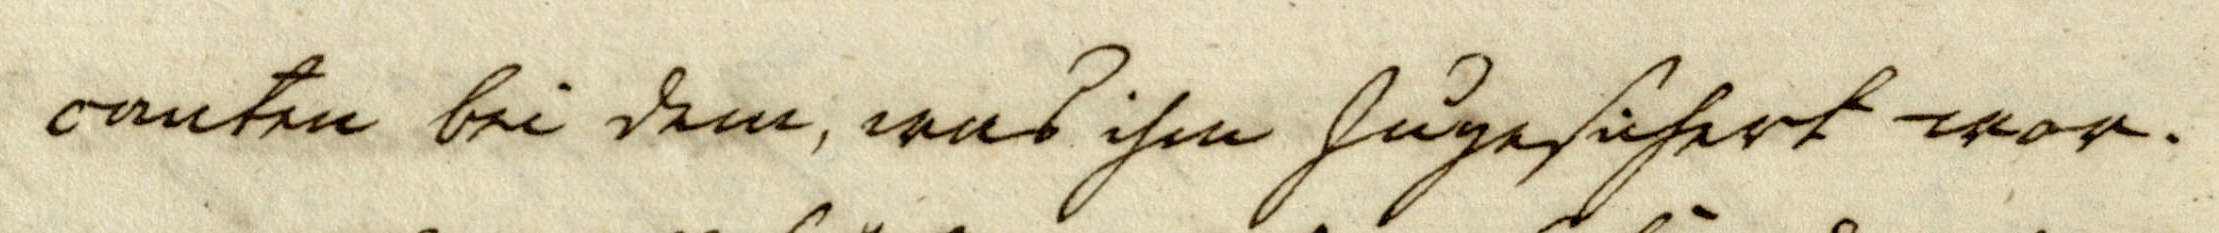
canten bei dem, was ihm zugesichert wor¬
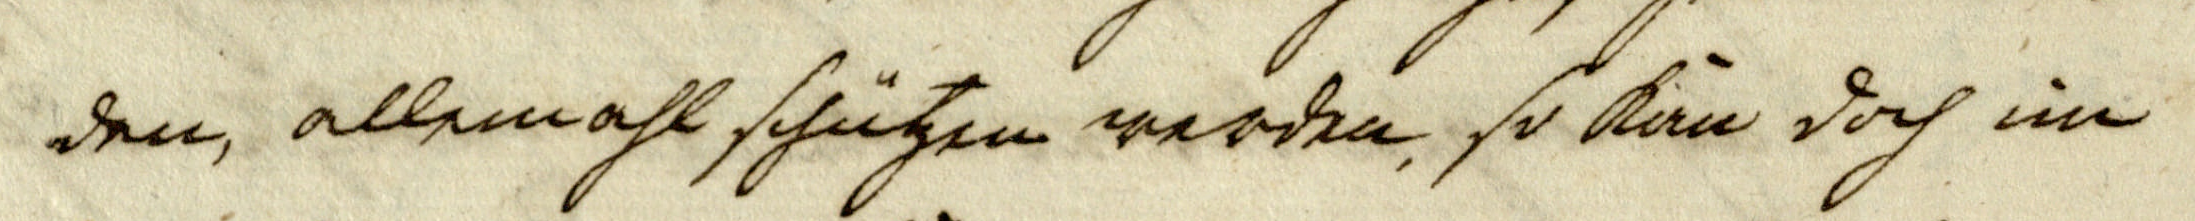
den, allemahl schützen werden, so kan doch im
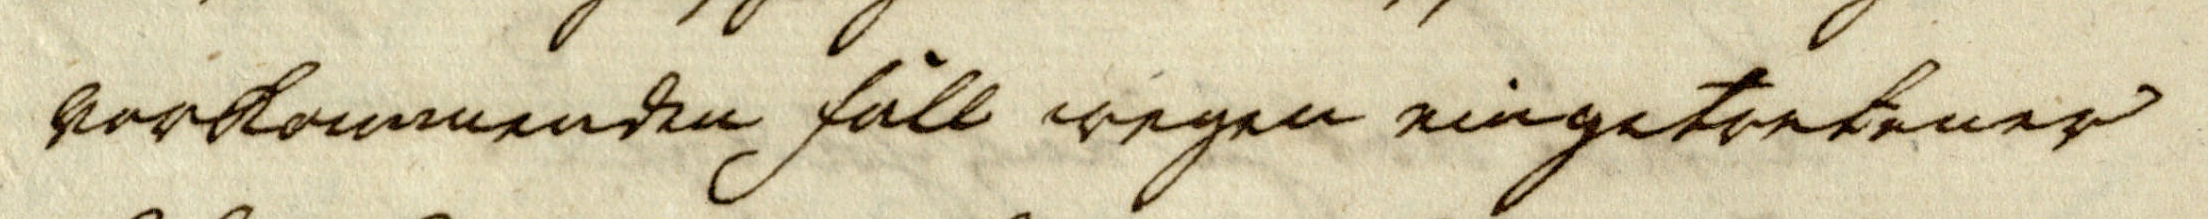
vorkommenden Fall wegen eingetretener
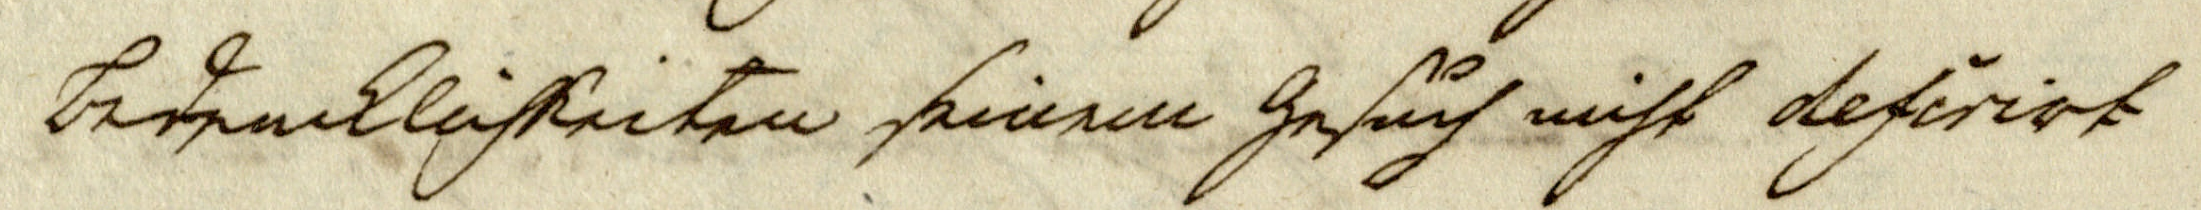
Bedencklichkeiten seinem Gesuch nicht deferirt
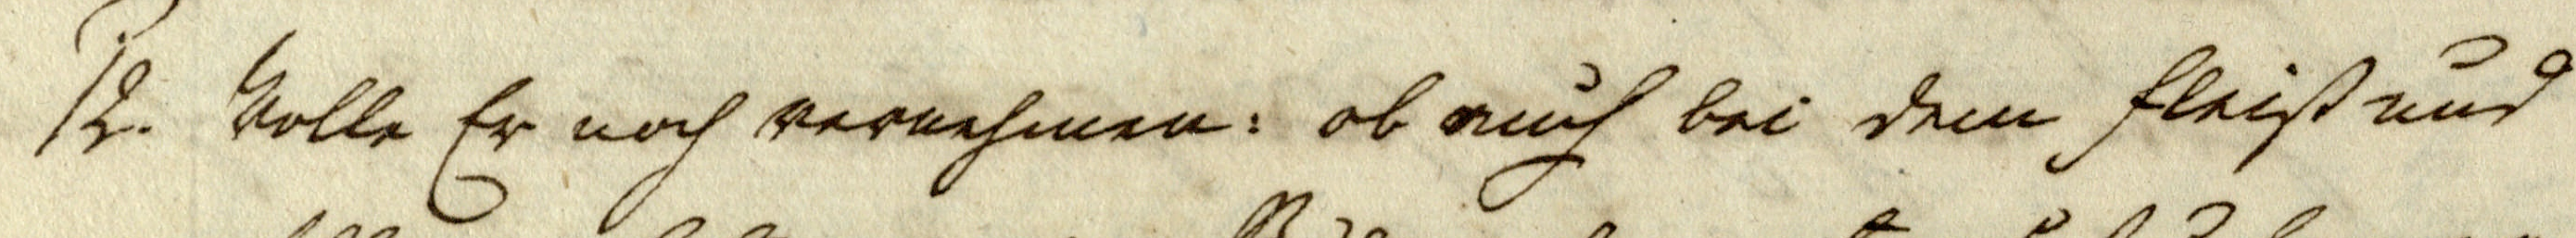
12. Wolle Er noch vernehmen: ob auch bei dem Fleiß und
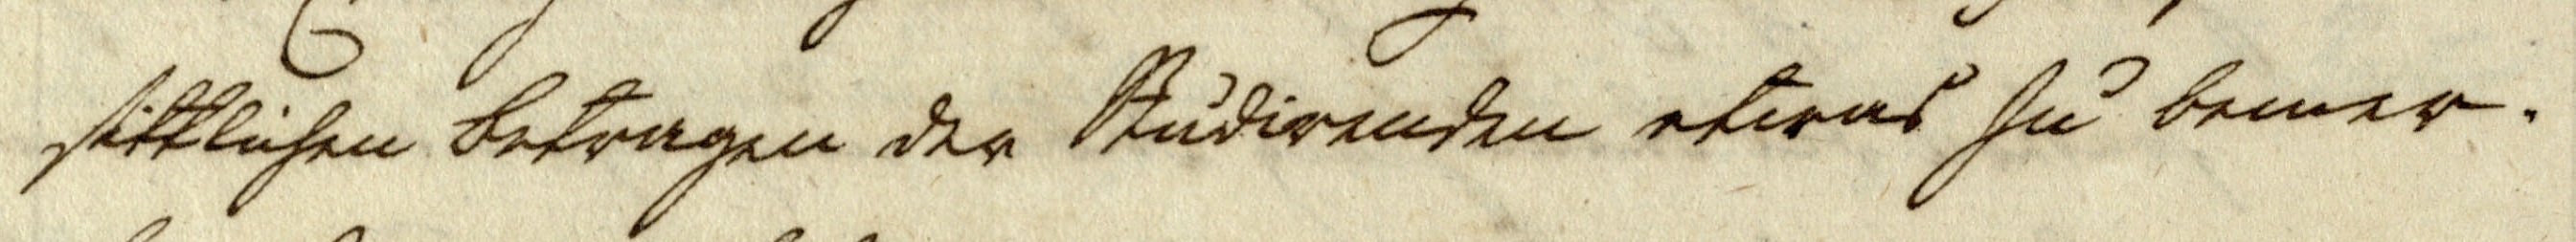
sittlichen Betragen der Studirenden etwas zu bemer¬
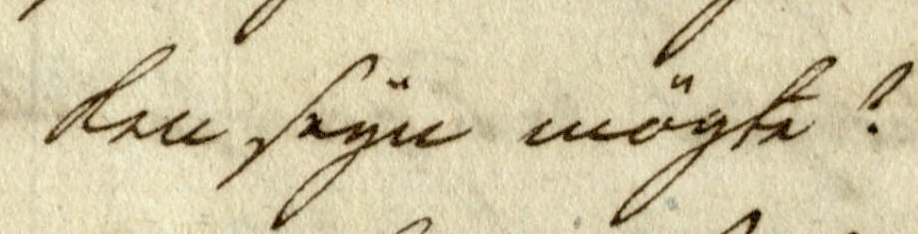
ken seÿn mögte?
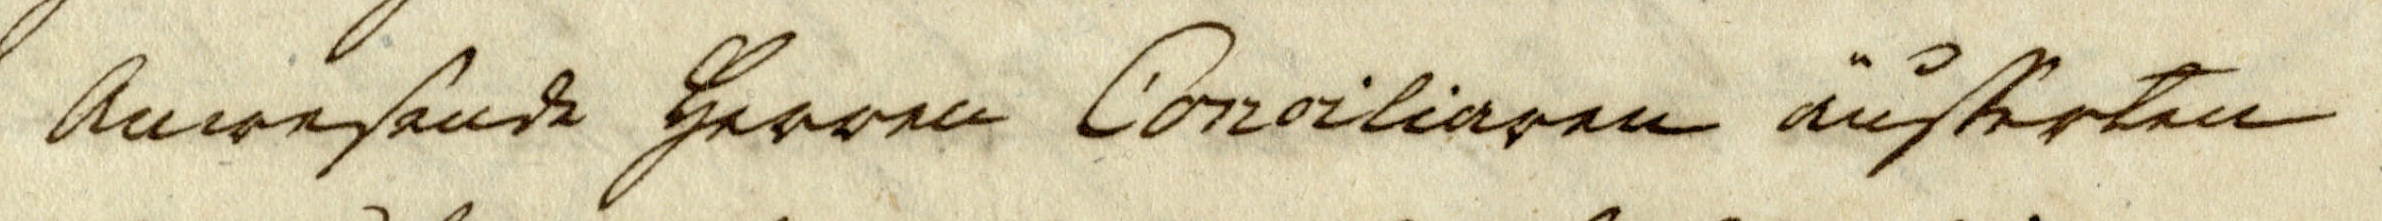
Anwesende Herren Conciliaren äusserten
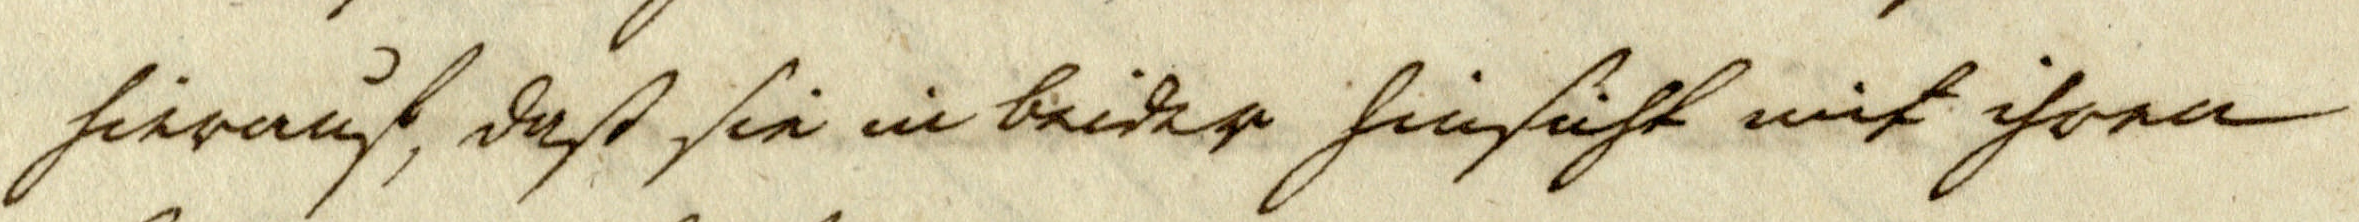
hierauf, daß sie in beider hinsicht mit ihren
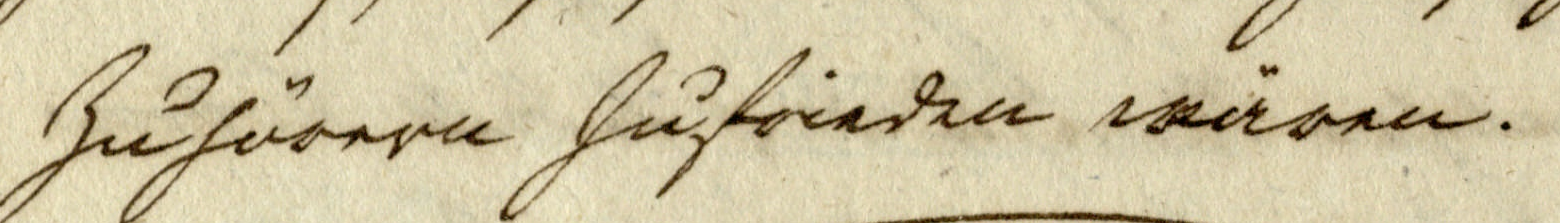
Zuhörern zufrieden wären.
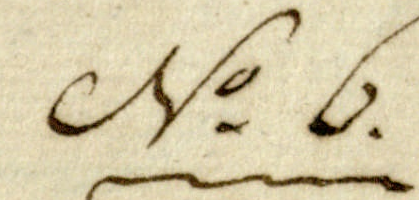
Nº 6.
